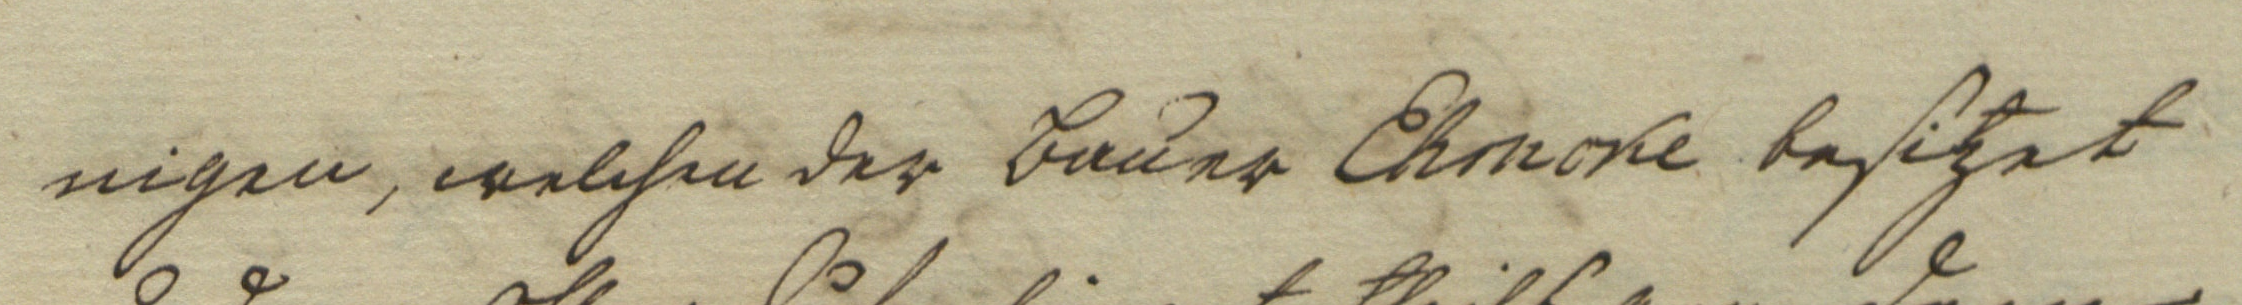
nigen, welchen der Bauer Ehmcke besitzt
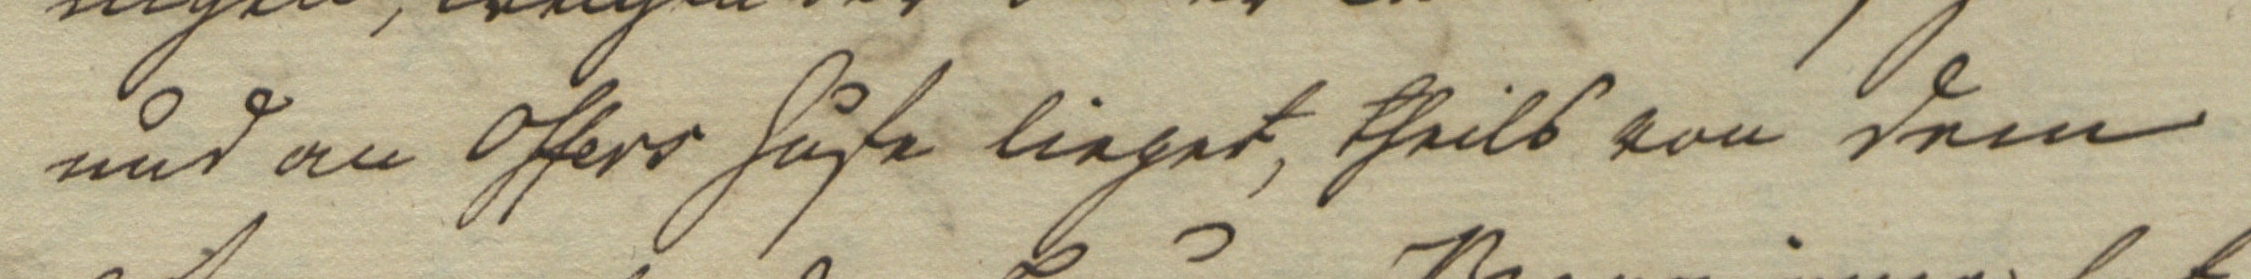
und an Offers Hufe liegt, theils von dem
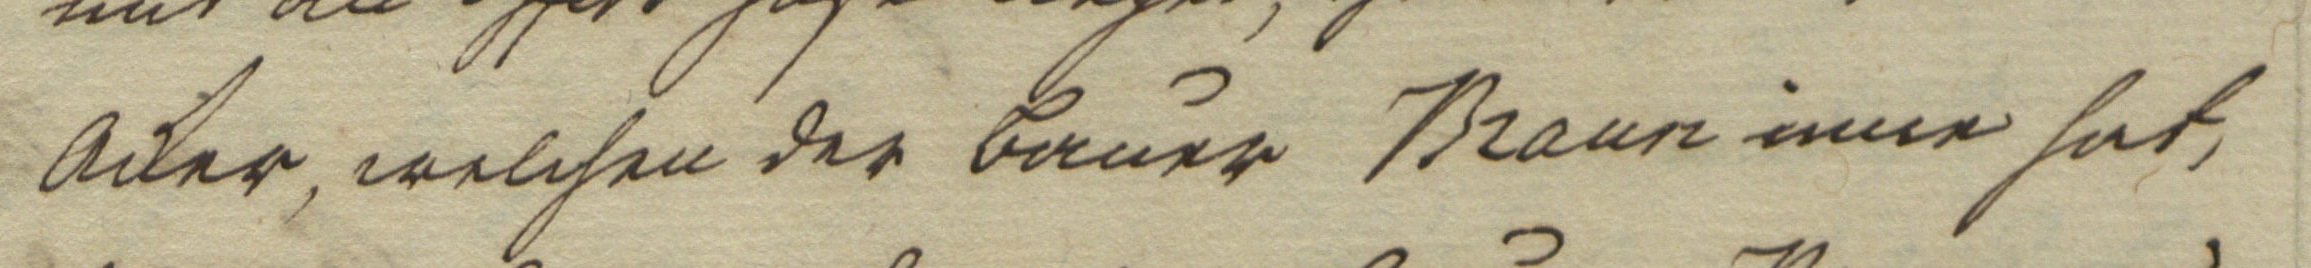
Acker, welchen der Bauer Braun inne hat,
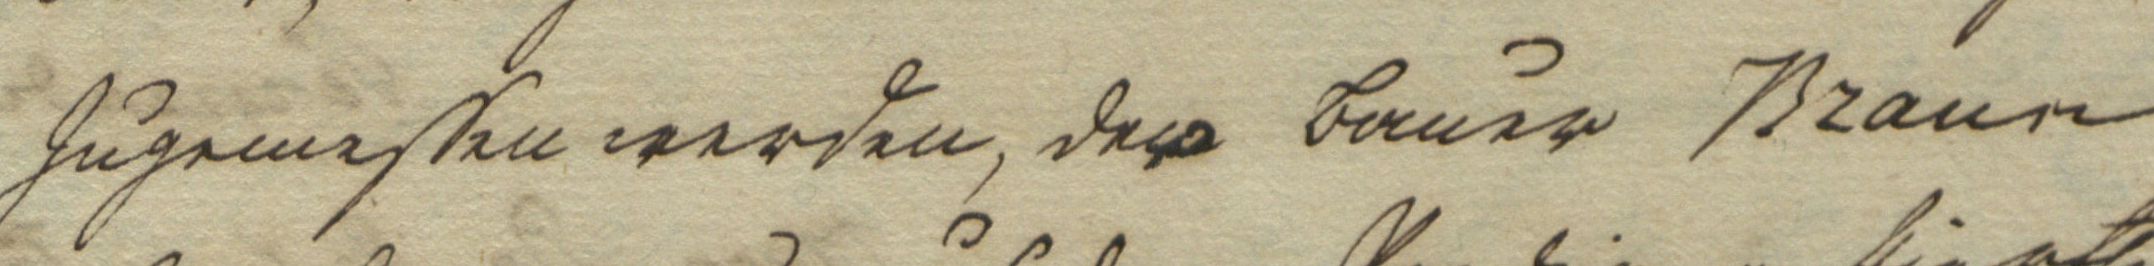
zugemessen werden, der Bauer Braun
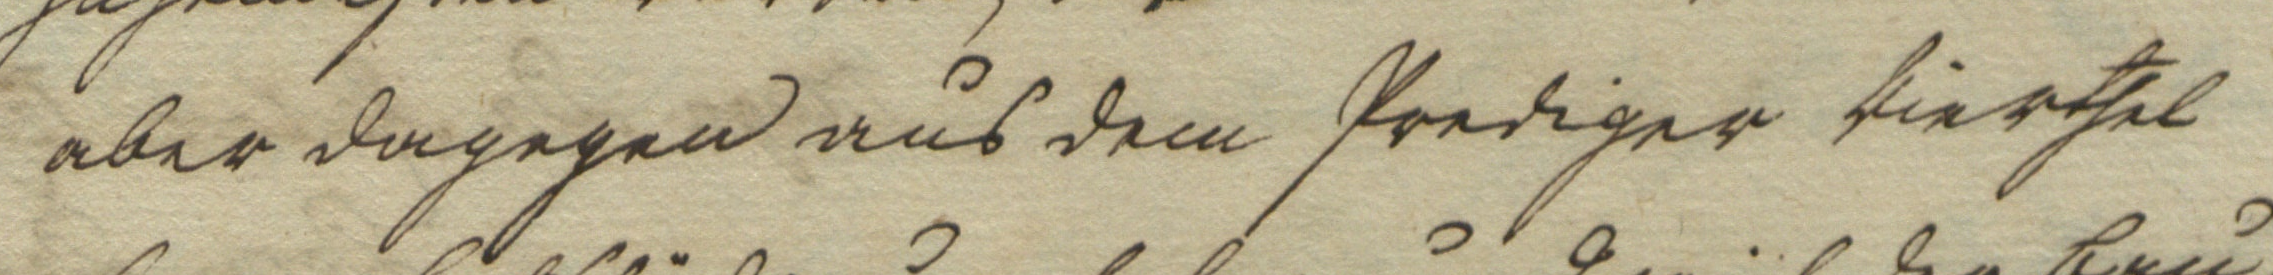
aber dagegen aus dem Prediger Vierthel
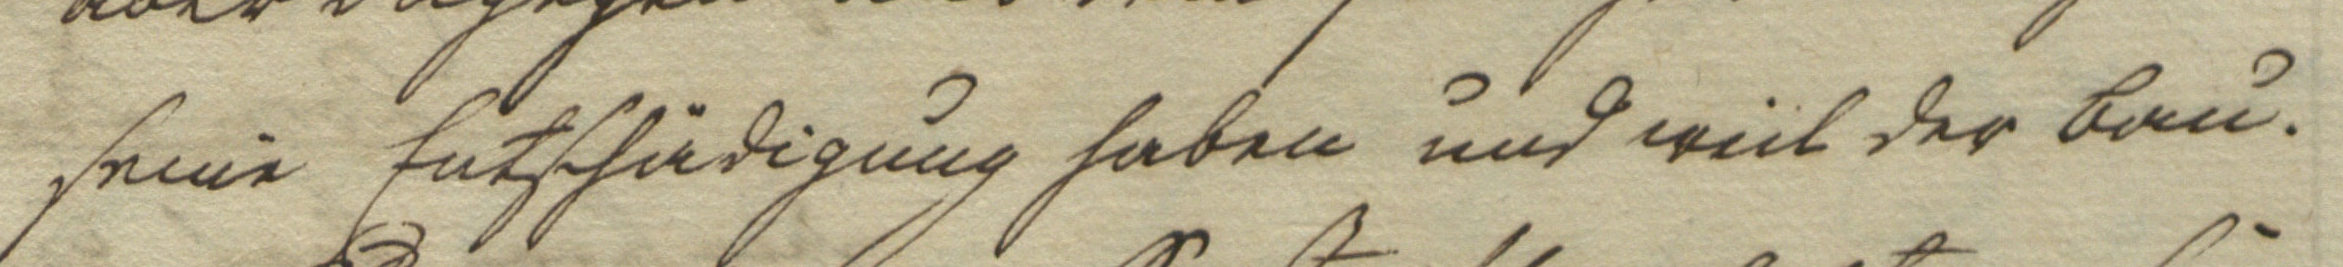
seine Entschädigung haben und weil der Bau¬
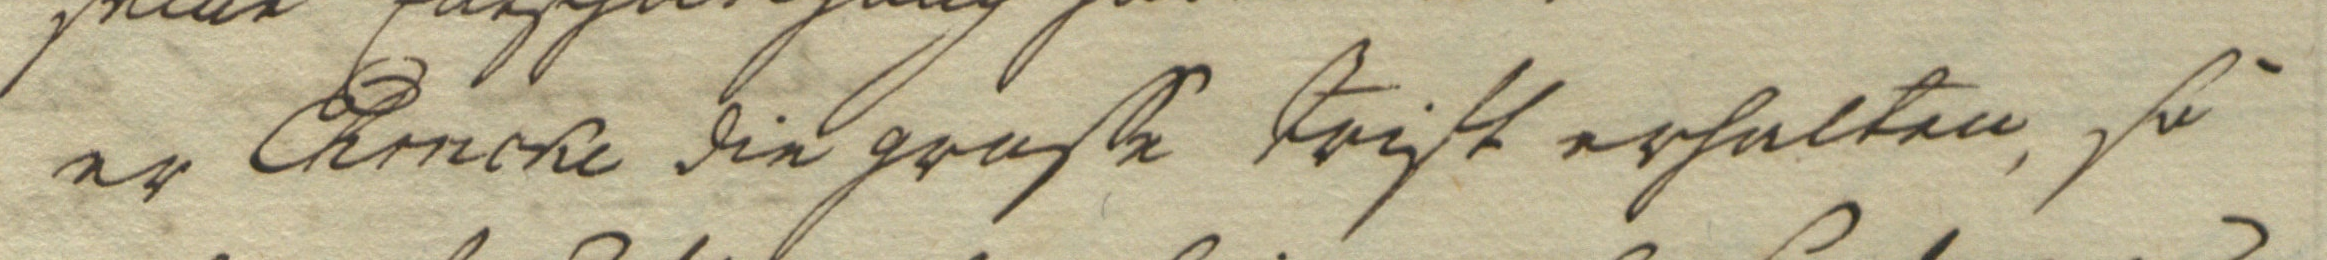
er Ehmcke die grosse Trift erhalten, so
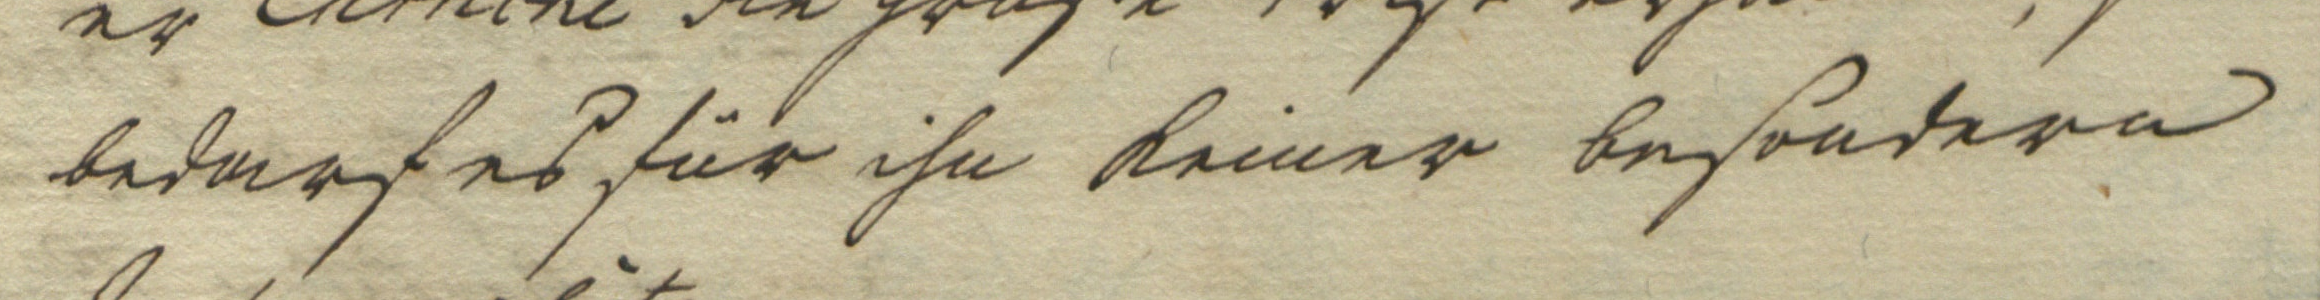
bedarf es für ihn keiner besondern
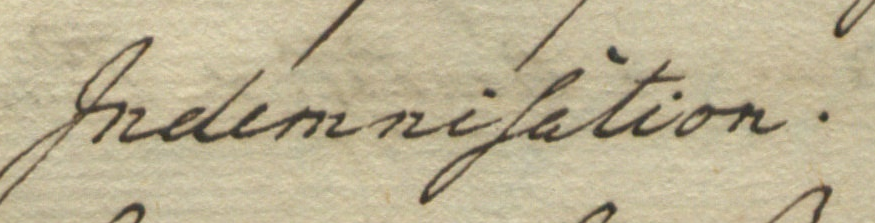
Indemnisation.
